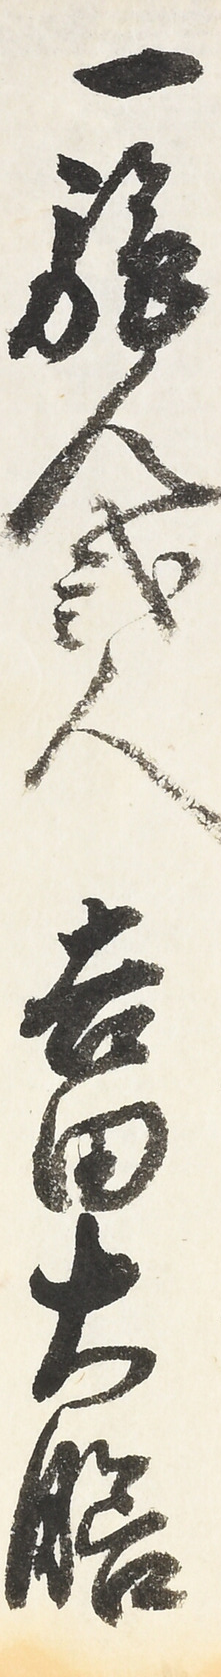一旅人弐人吉田大膳
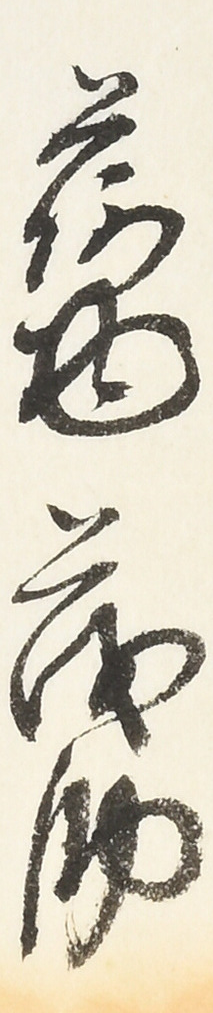荷物茂助
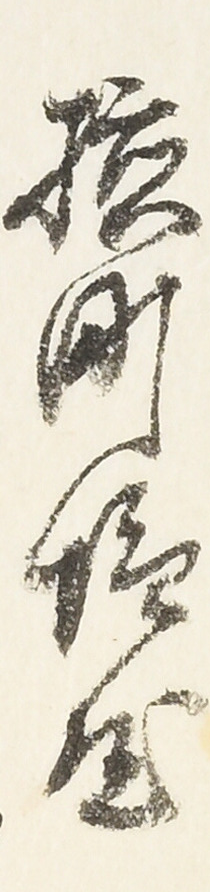横町塩屋
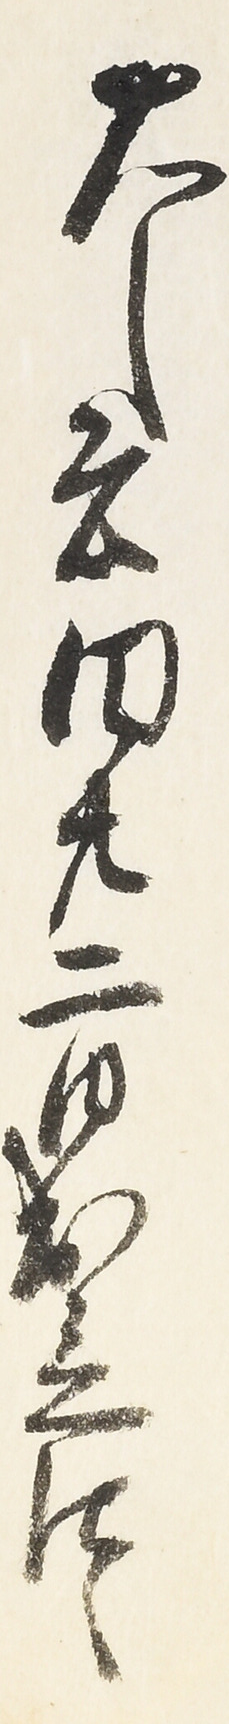右之者同廿二日出立仕候
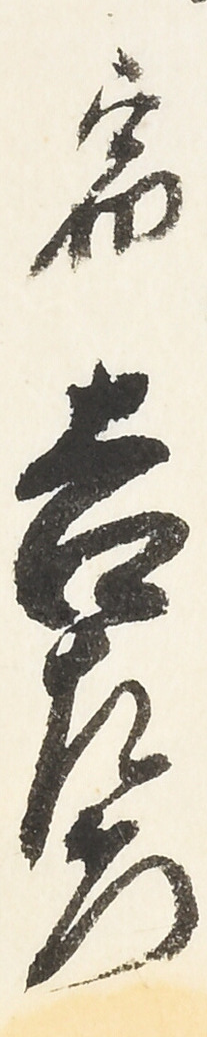宿吉左衛門
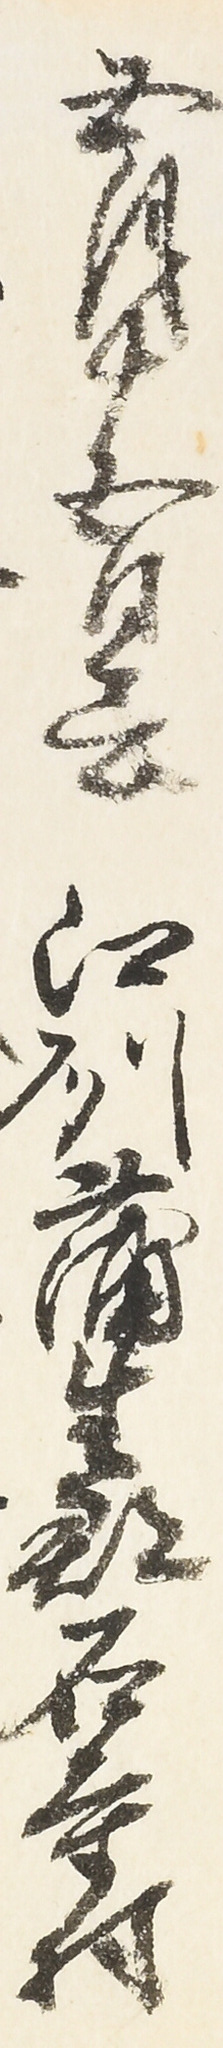五月十五日着江州蒲生郡石寺村
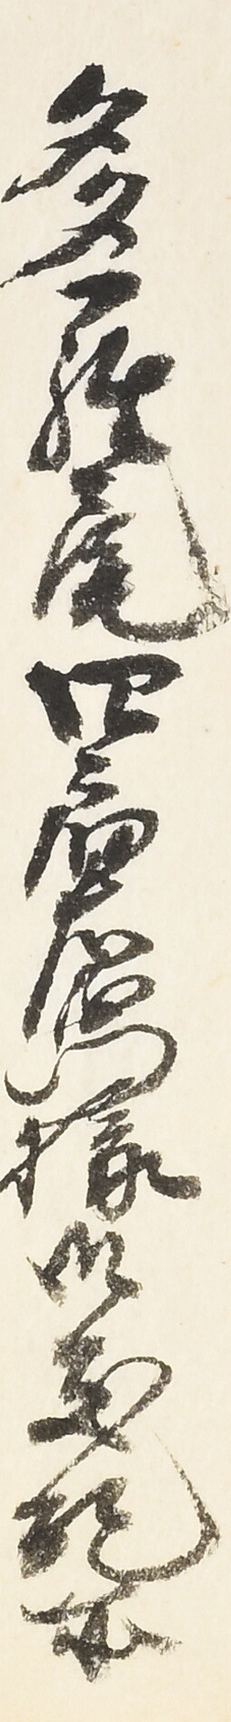多羅尾四郎右衛門様御支配所
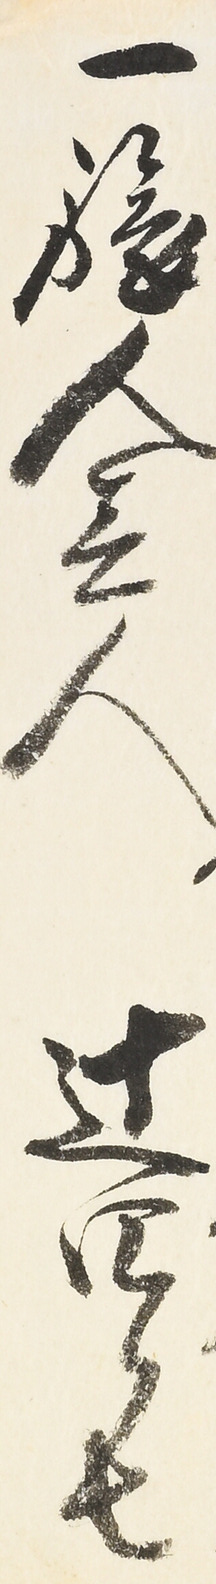一旅人壱人辻四郎七
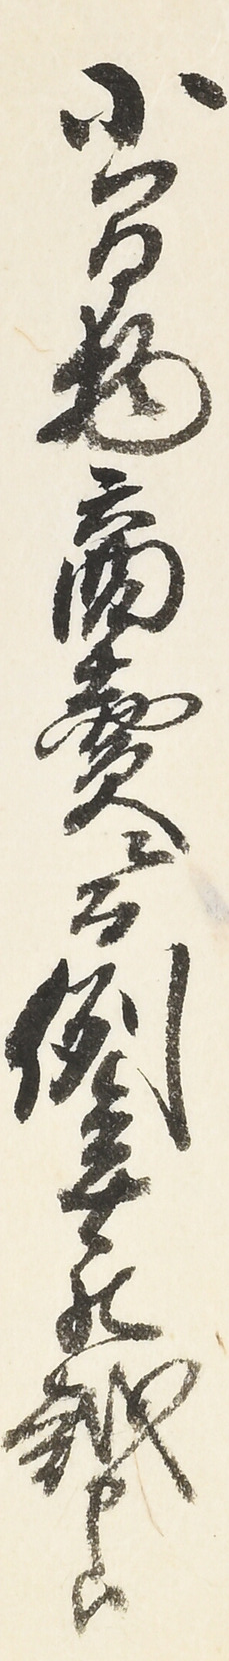小間物商売ニ而例年罷越申候
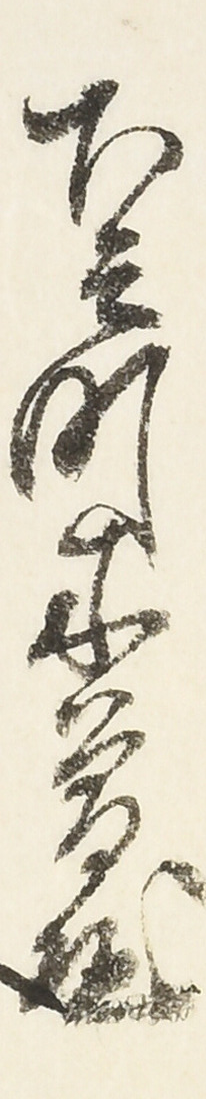下モ町木曽屋
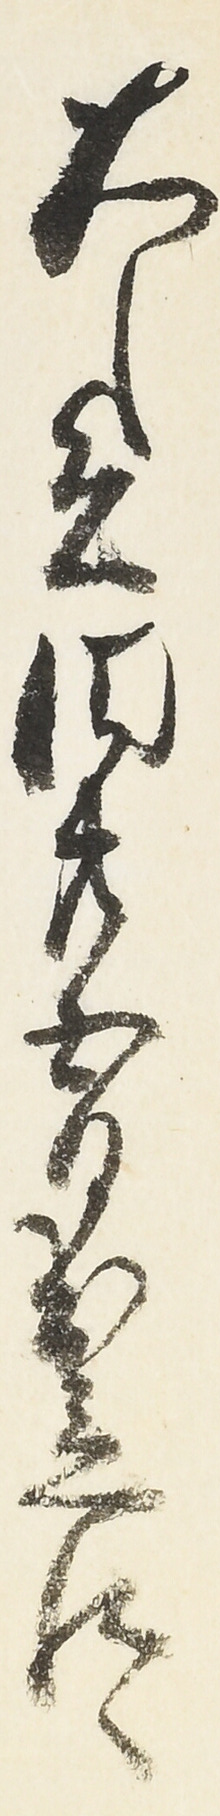右之者同廿五日出立仕候
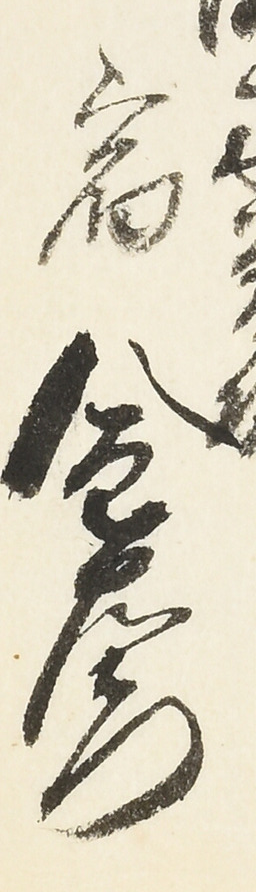宿金右衛門
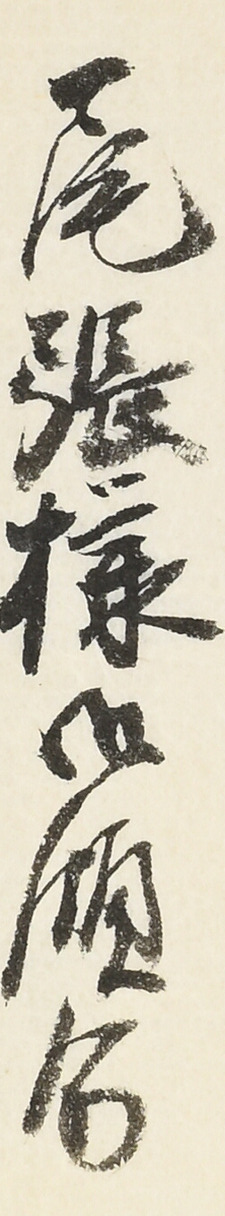尾張様御領分
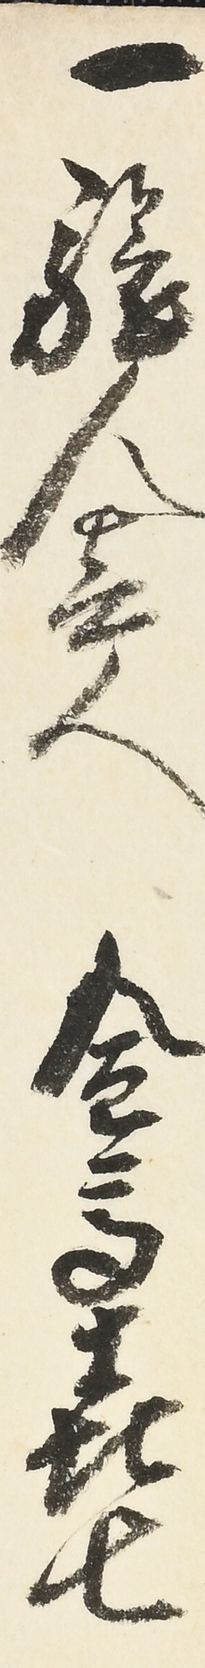一旅人壱人金高喜七
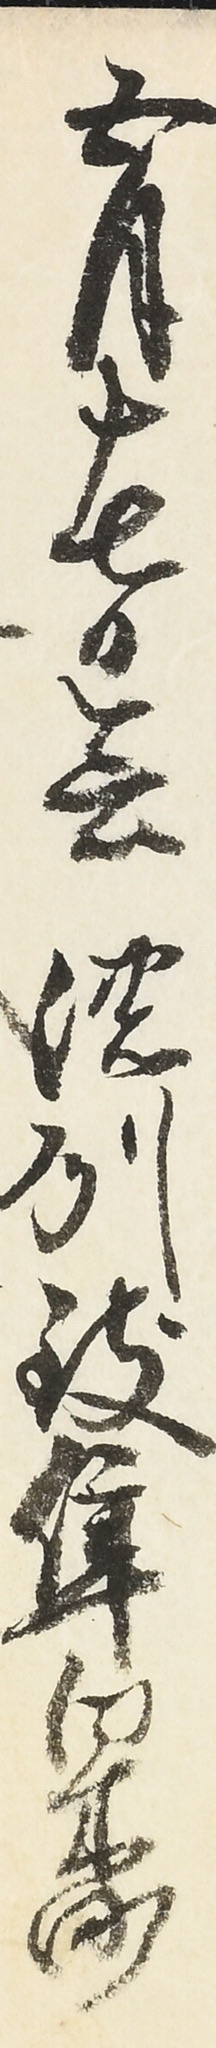五月十七日着濃州鈘隼白木町
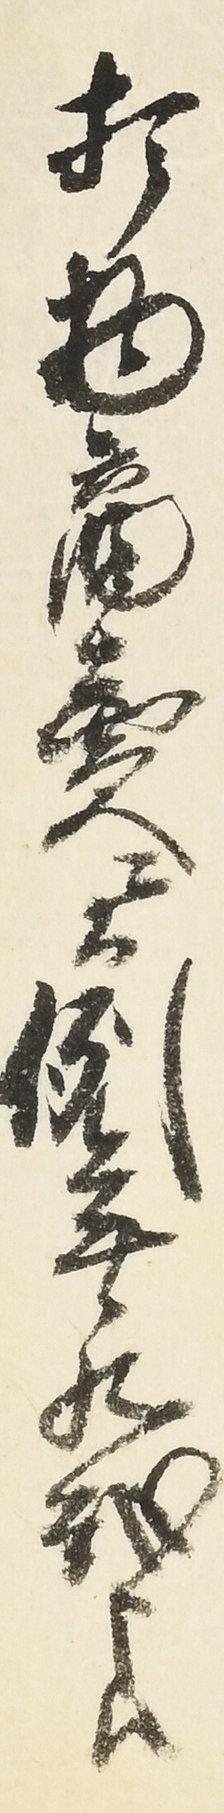打物商売ニ而例年罷越申候
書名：町中旅人泊控帳
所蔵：伊那市立高遠町図書館・合同会社AMANE
